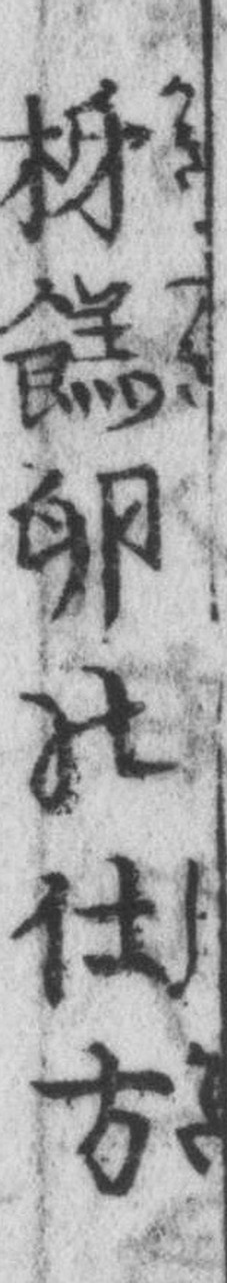柿餻卵の仕方
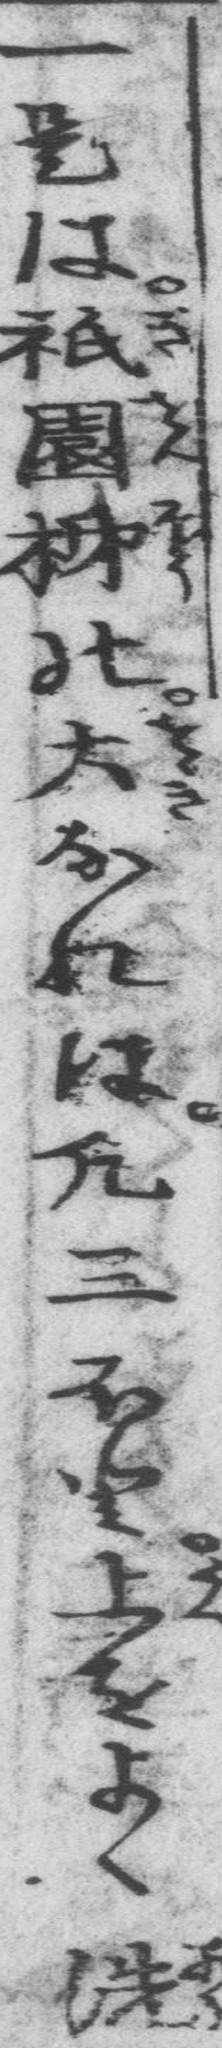一是は。祇園柿の。大なれは。凡三ほと。上をよく洗
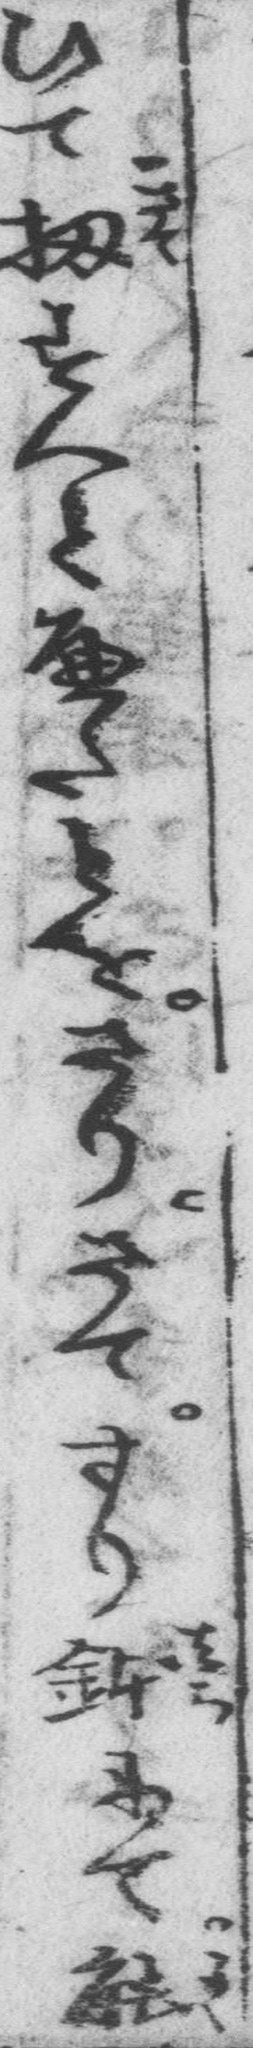ひて。扨すへとへたとを。さり。さて。すり鉢にて。能
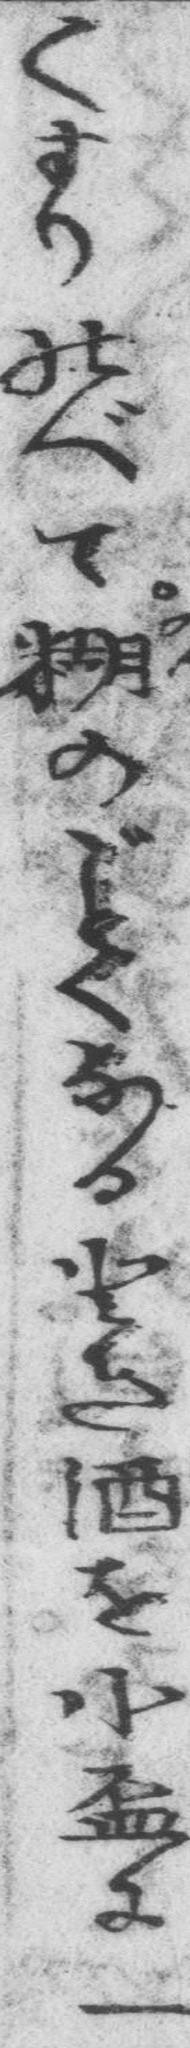くすりのべて。糊のごとくなるとき酒を小盃に。一
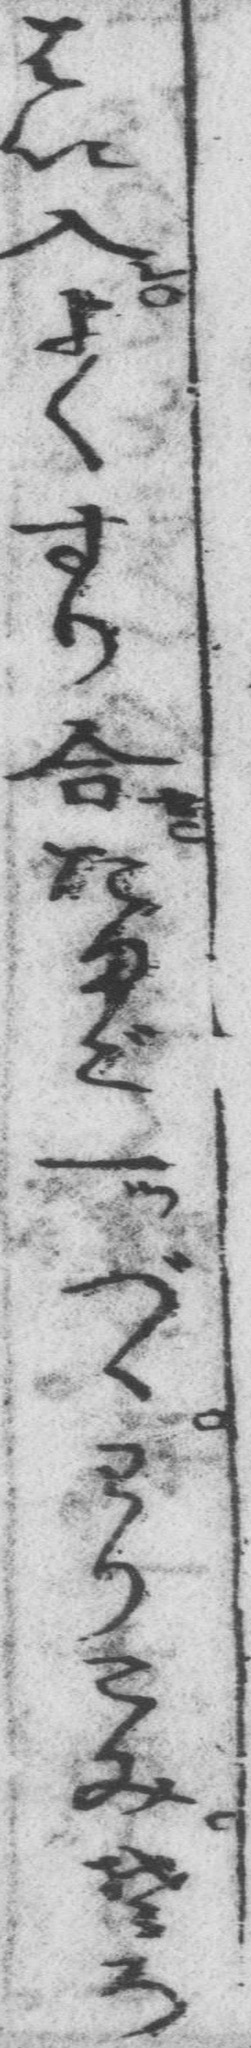はい入れ。よくすり合せたまご一ツづゝ。わりこみ。そろ
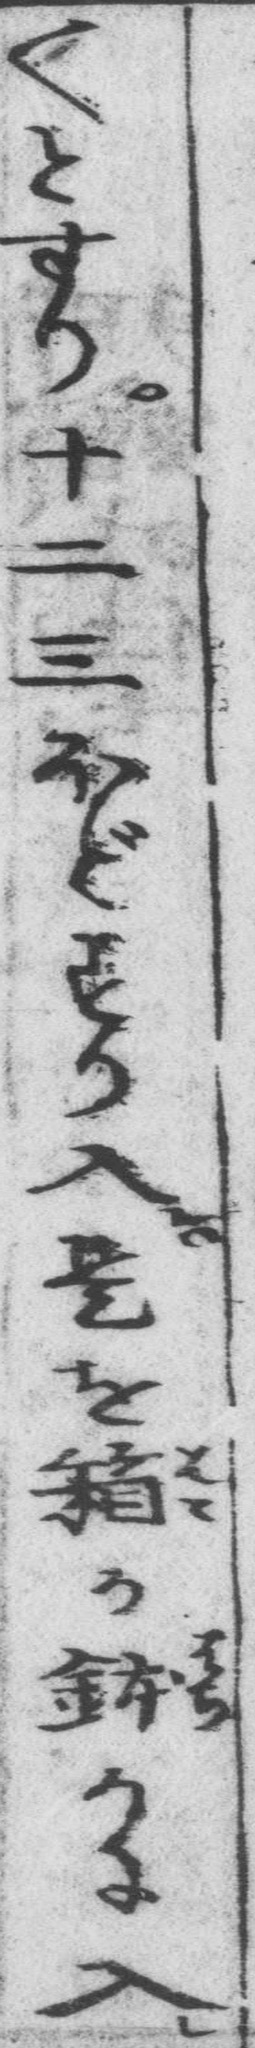〳〵とすり。十二三ほどすり入れ。是を箱か鉢かに入れ
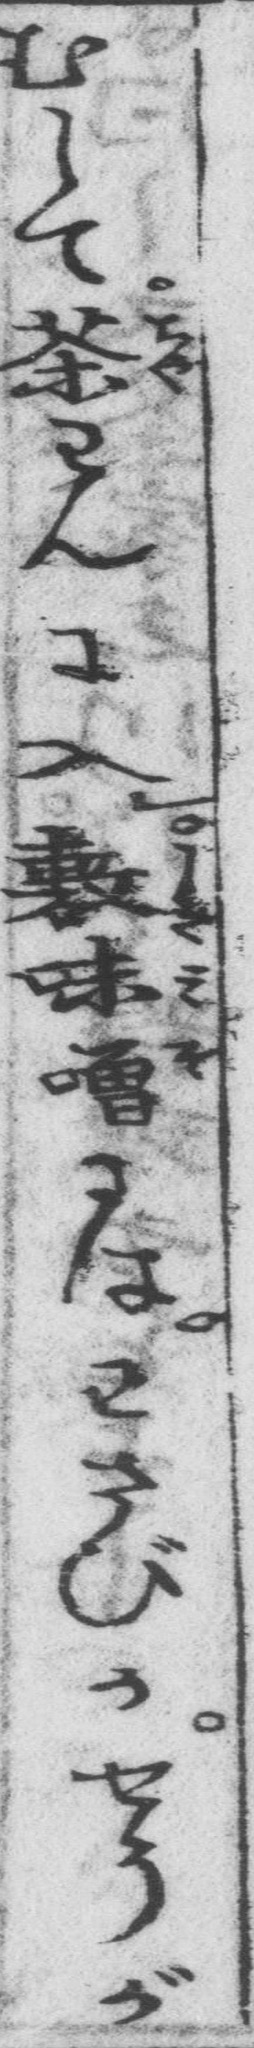むして。茶わんに入れ。敷味噌には。わさびか。せうが
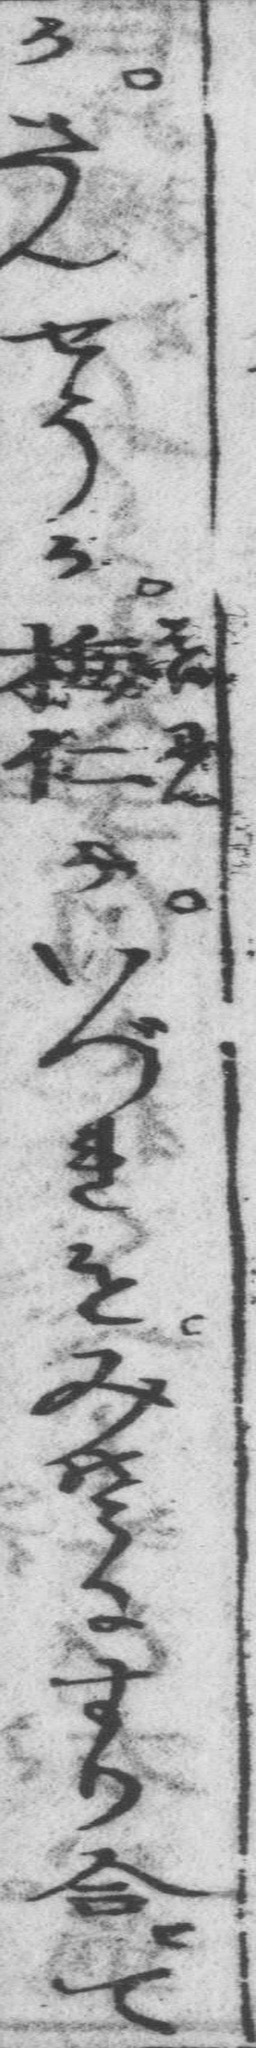か。さんせうか。梅仁か。いづれもみそにすり合せて
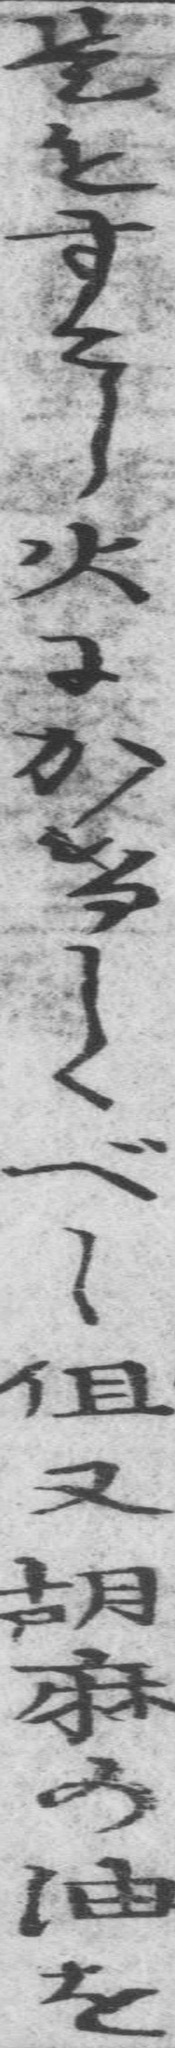是もすこし火にかけ。しくべし。但又胡麻の油を
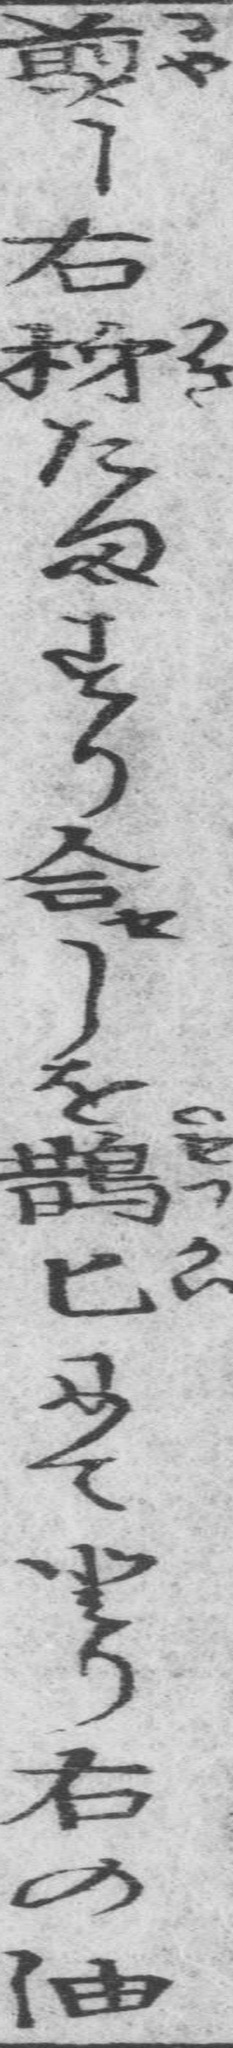煎し右柿たますり合せしを。鵲匕にてとり右の油
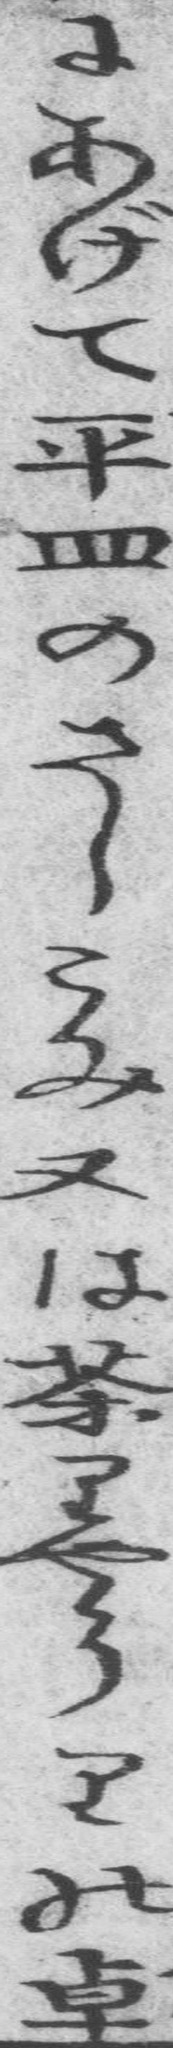にあげて。平皿のさしこみ。又は茶りやうりの。卓
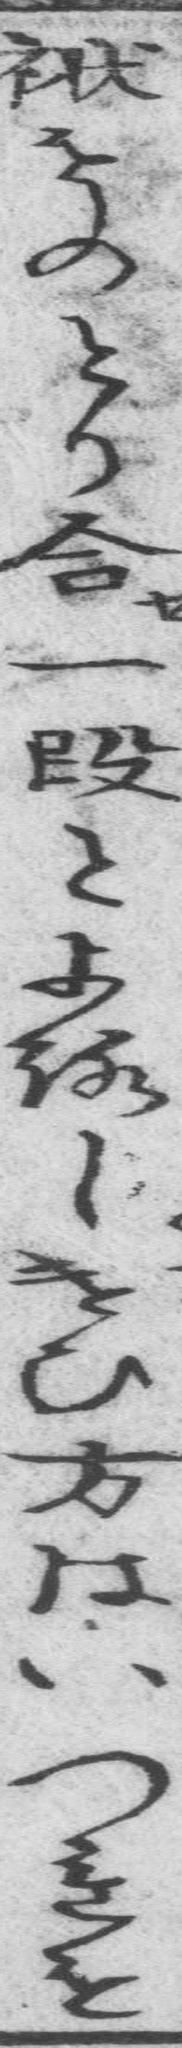袱ものとり合せ。一段とよろし。遣ひ方は。いつれも
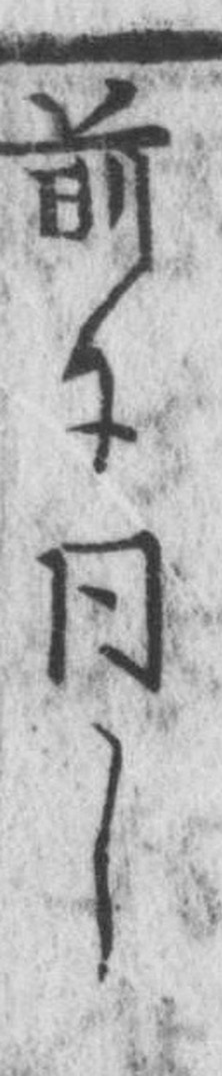前に同し
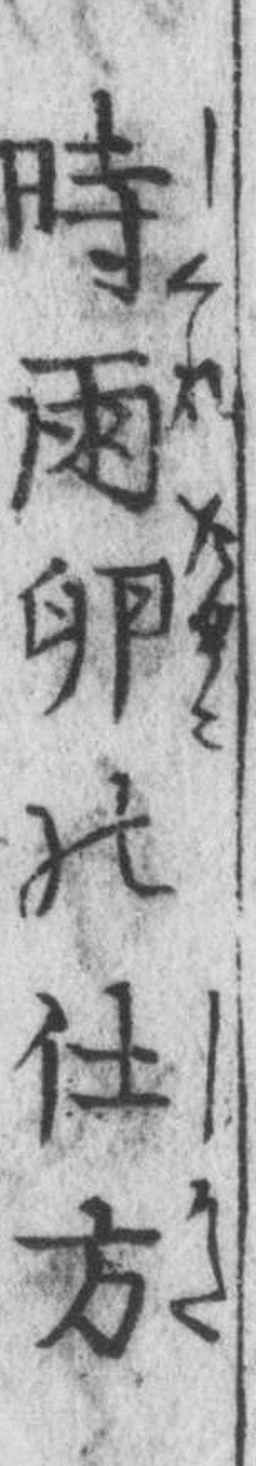時雨卵の仕方
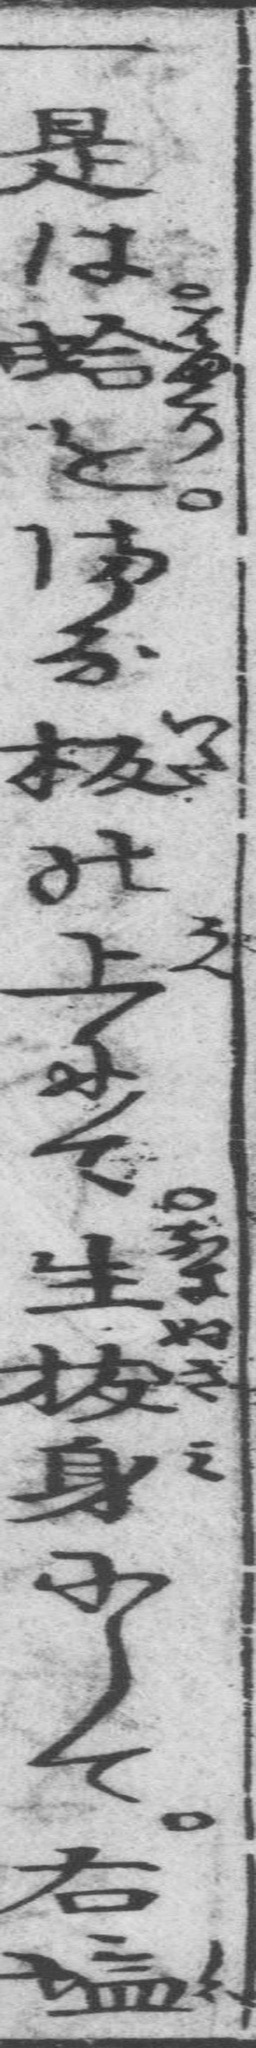一是は。蛤を。まな板の上にて。生抜身にして。右塩
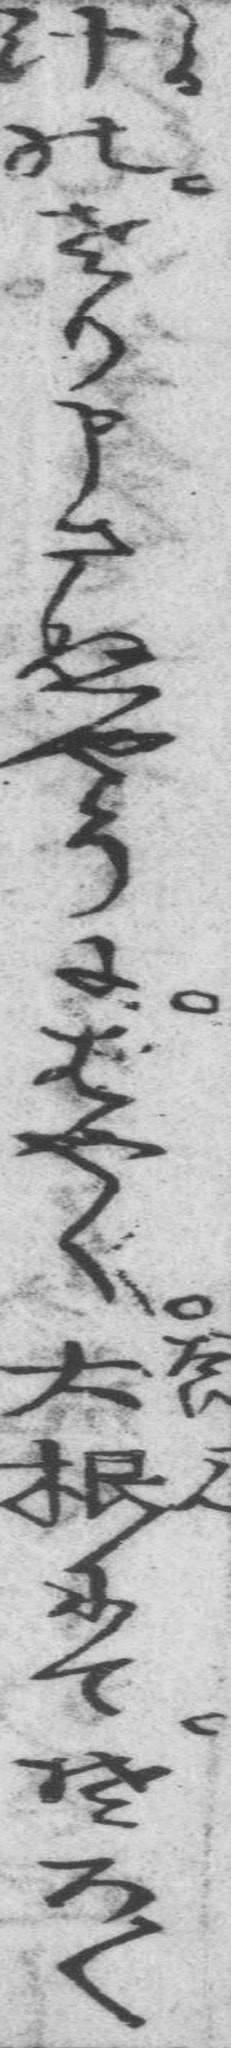汁の。さり申さぬやうに。はやく。大根にて。そろ〳〵
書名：萬寳料理秘密箱
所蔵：大阪府立大学学術情報センター 国文学研究資料館
